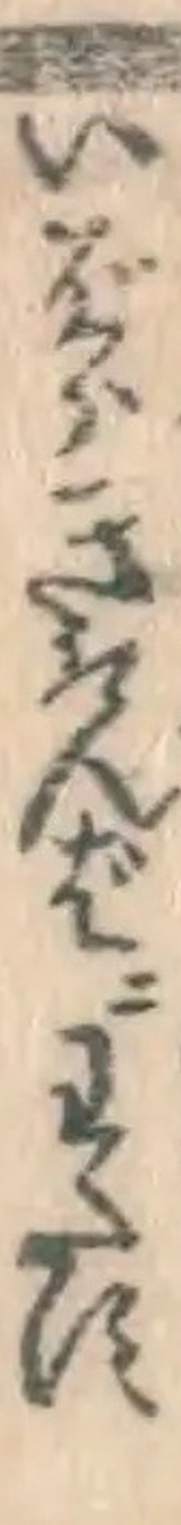いばらきけんばにわたす
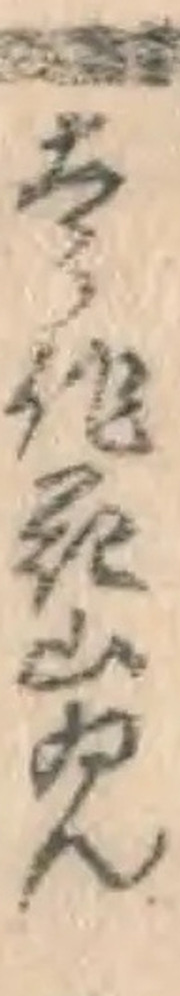太郎作花山ゐん
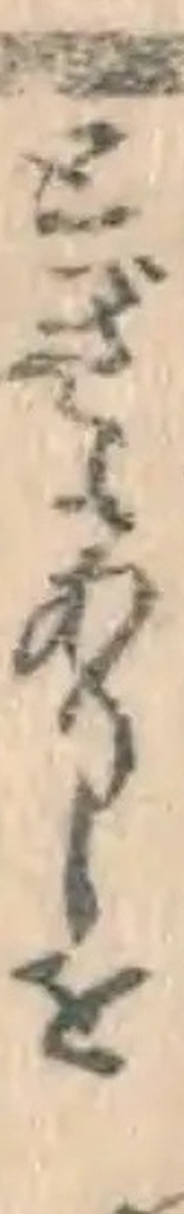とぎよありしを
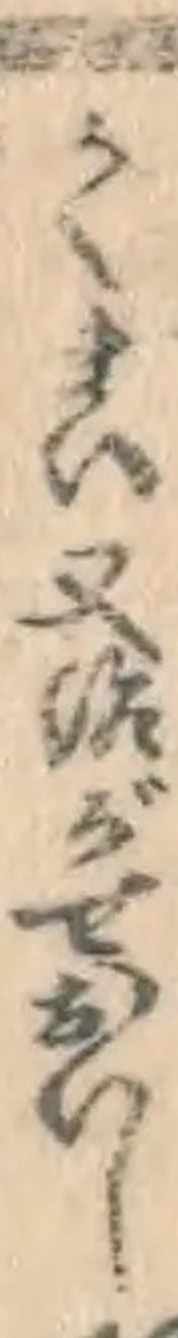かくまい又治がせおいし
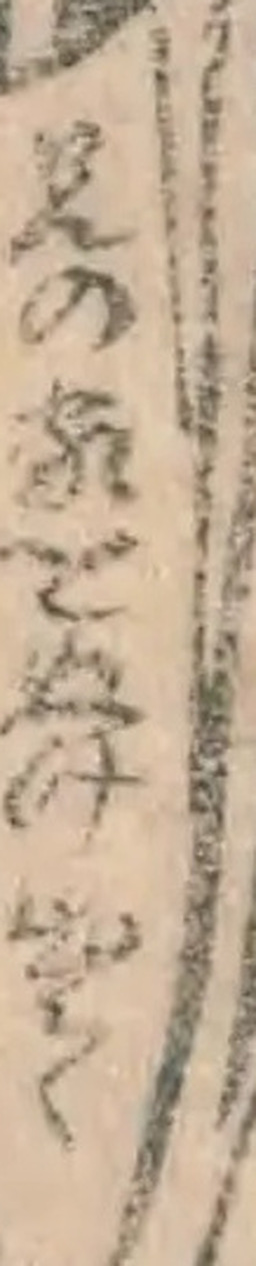兄の家をぬけ出て
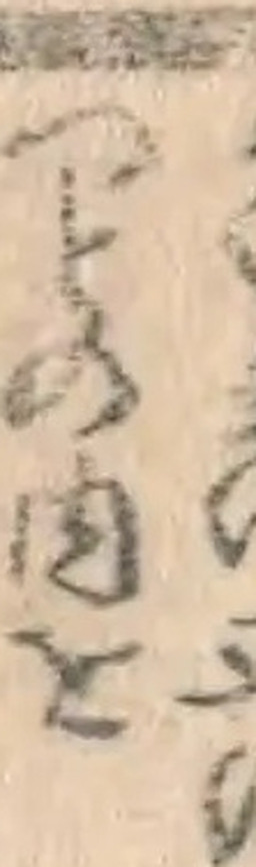つとの内を
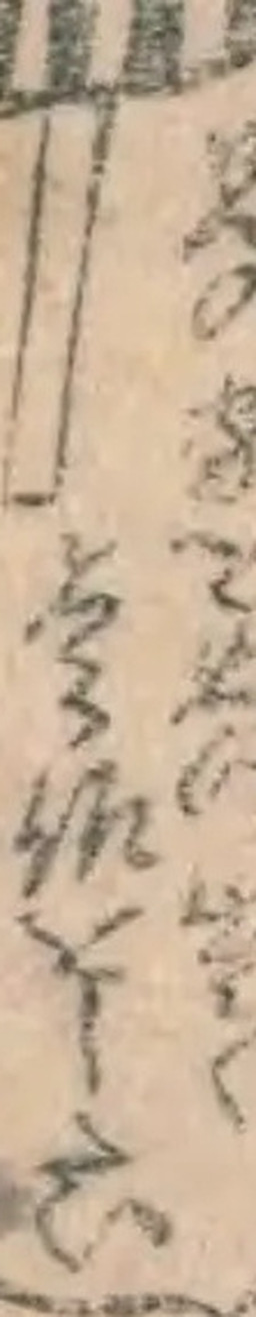たろ作をしたい
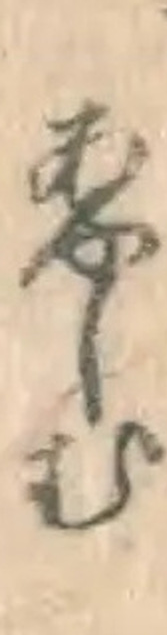あやしむ
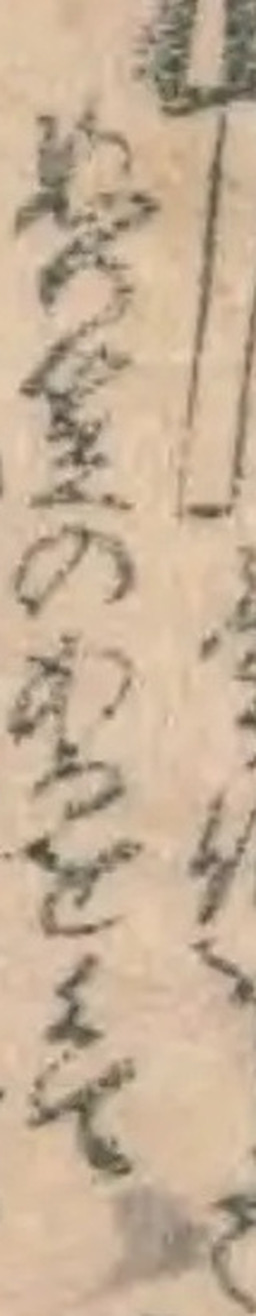ぬり笠のあるをみて
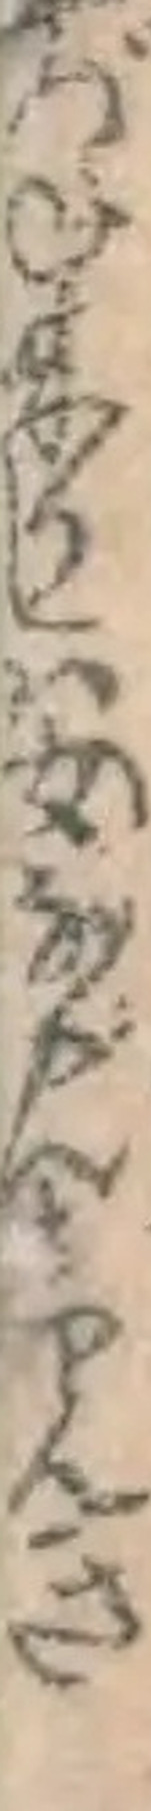たづね来りしは女ならんけんき
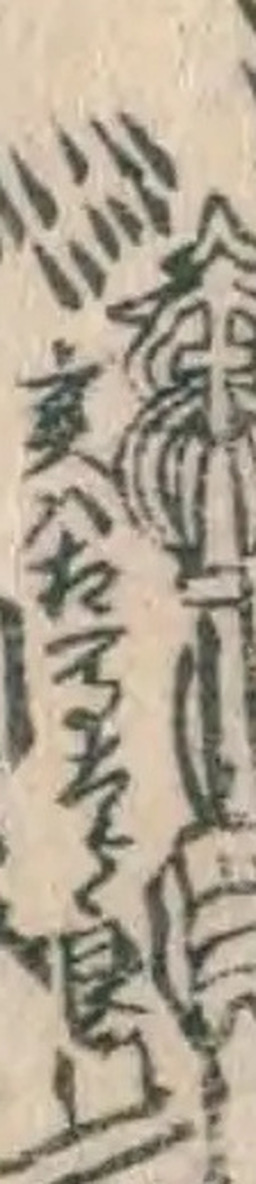実は相馬太郎良門
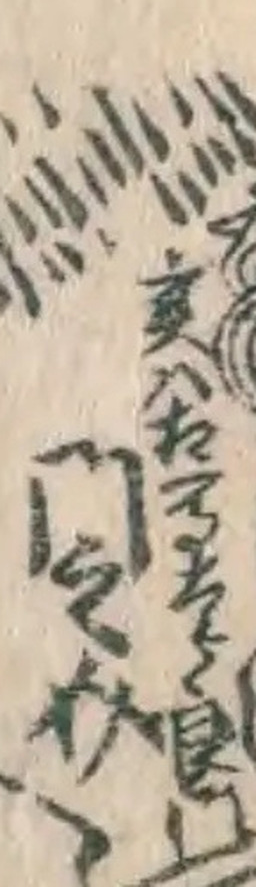門之介
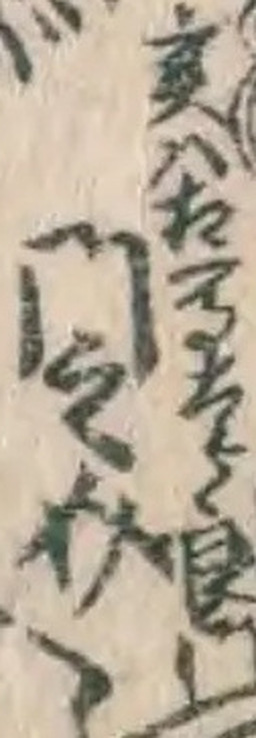門之介
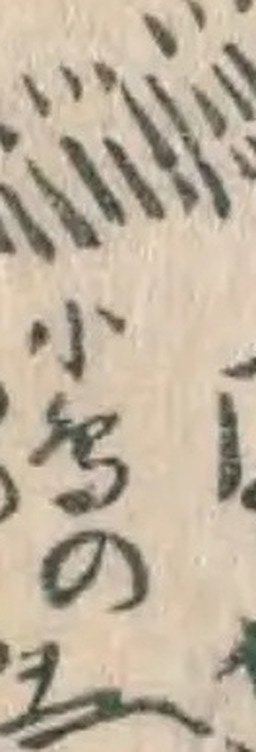小鳥の
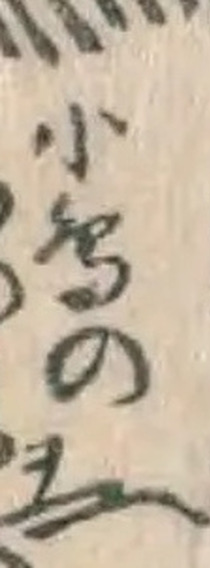小鳥の
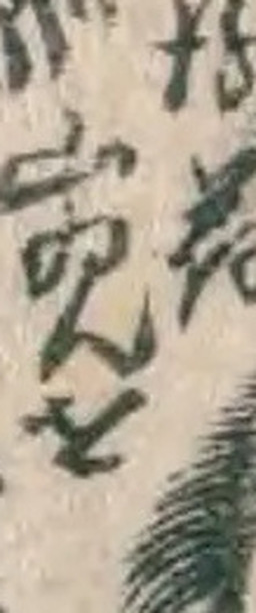山ゐんを
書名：四天王宿直着綿
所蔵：国立国会図書館 National Diet Library, JAPAN
